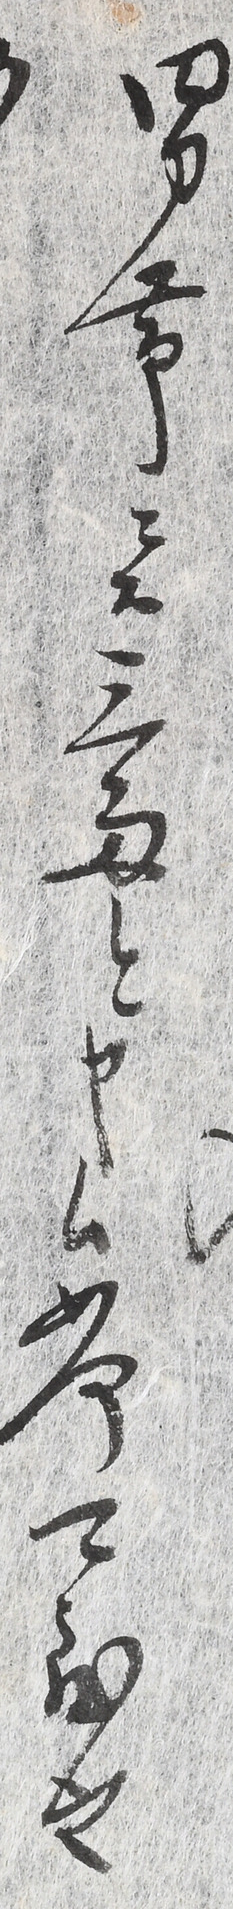男帯ニ而三両と申候如何可致ヤ
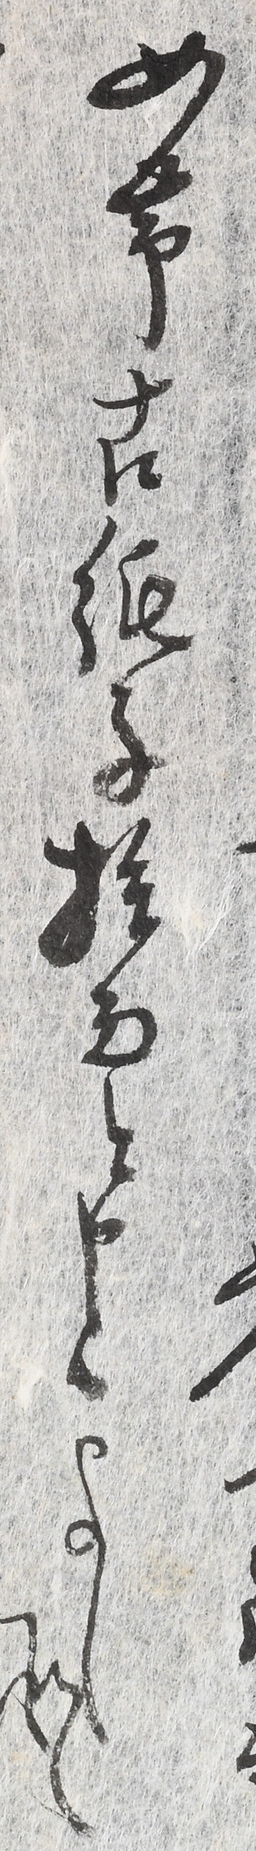女帯古紙子拾両と申候よし承候
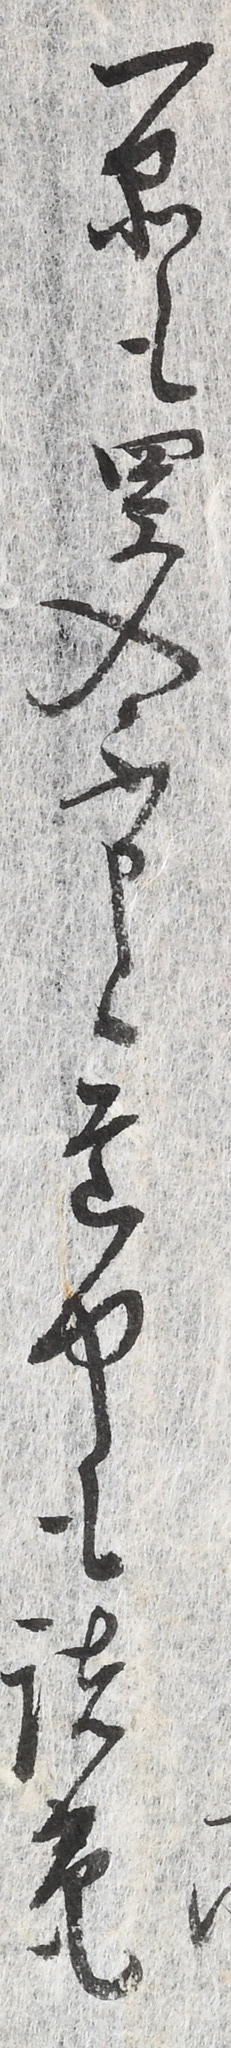一品も買入不申候道中も諸色
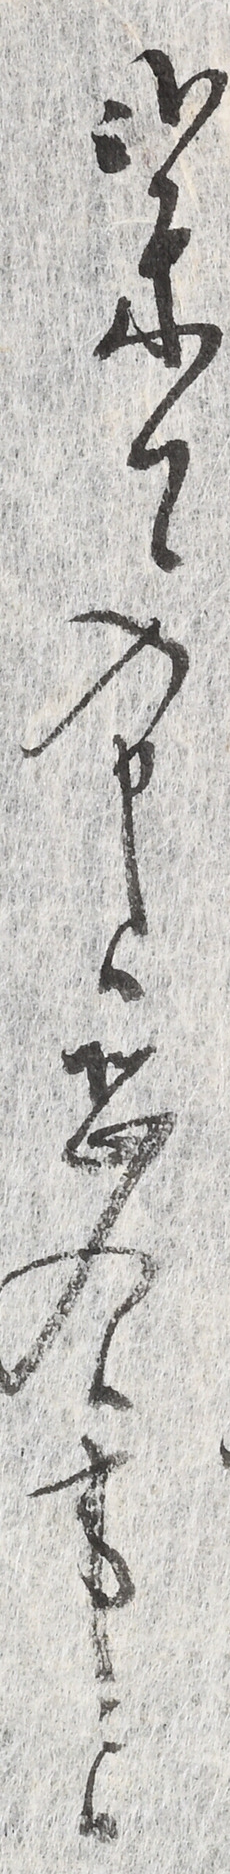弐朱ツヽ入申候恐入候事ニ候
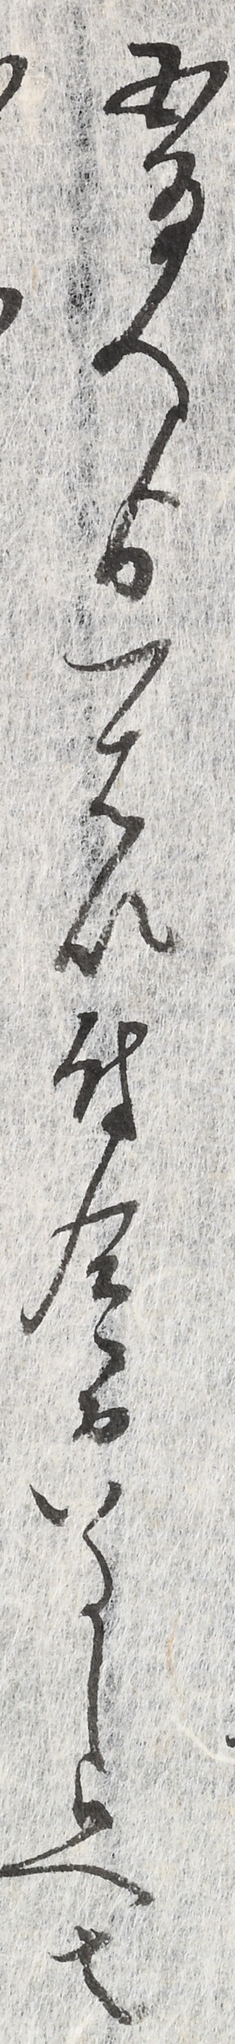五百文ゟ一はい付合ニ而いたし候へ者
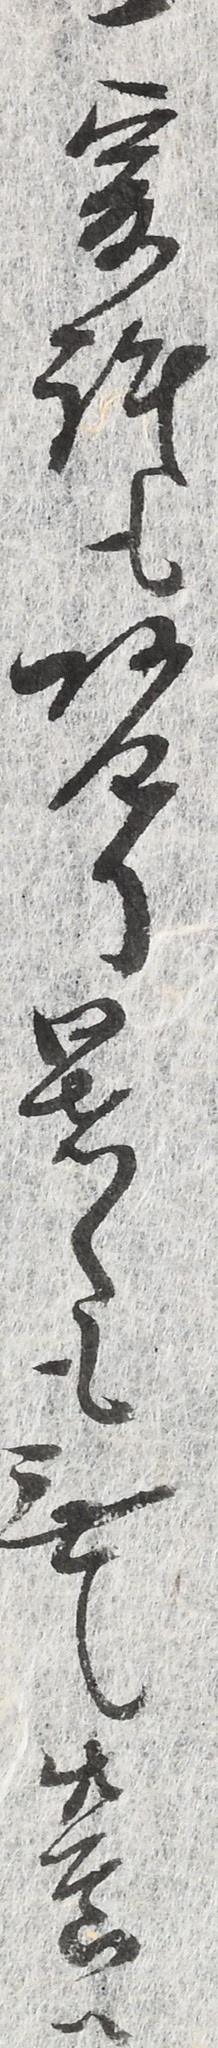一爰許もあまり暑くも無之此節ニハ
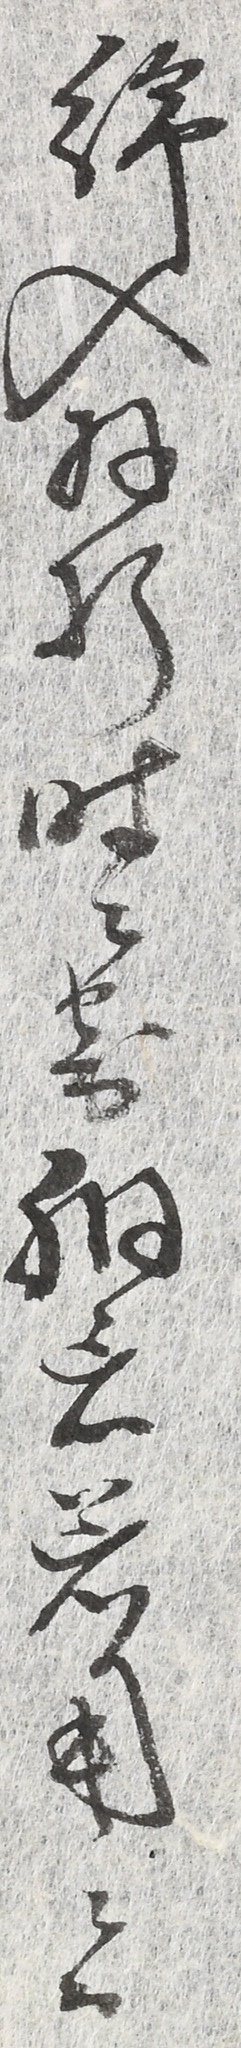綿入羽折時ニ寄胴着着用ニ而
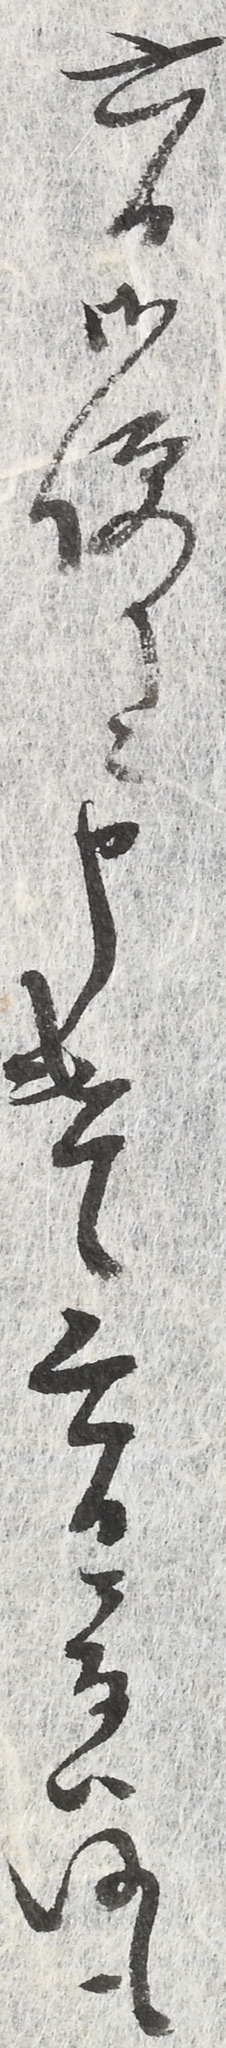六日御便りニ申遣候今日ニ而ハ何も
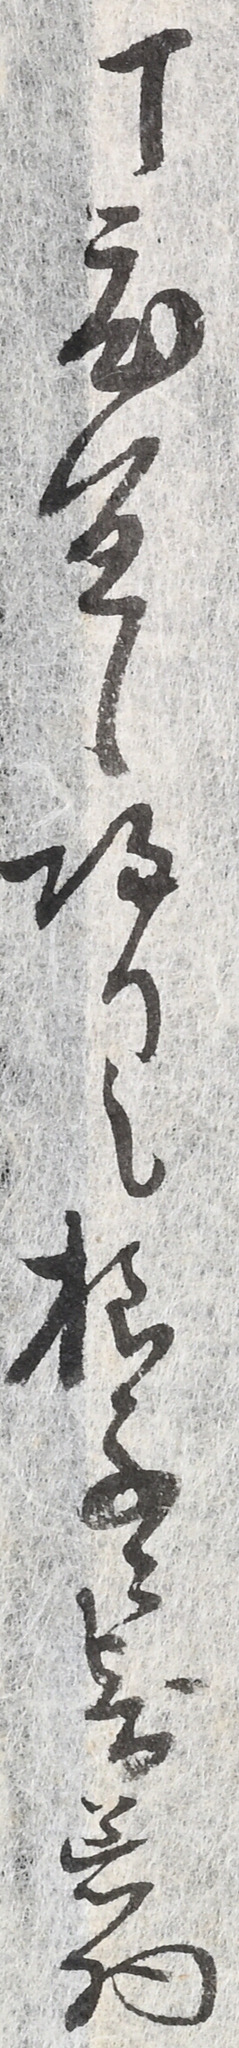丁度宜しく帰り之様子ニ寄着物
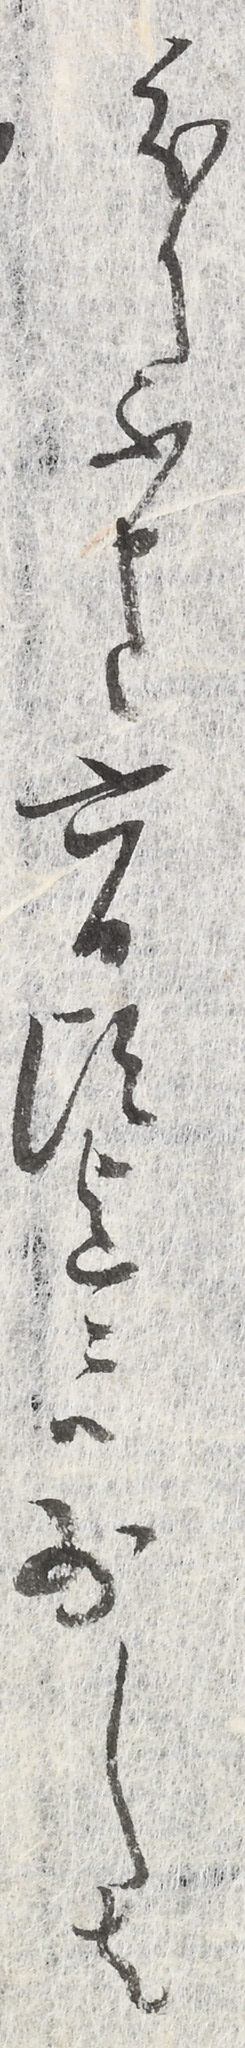分り不申候六日頃迄二ハ少し者
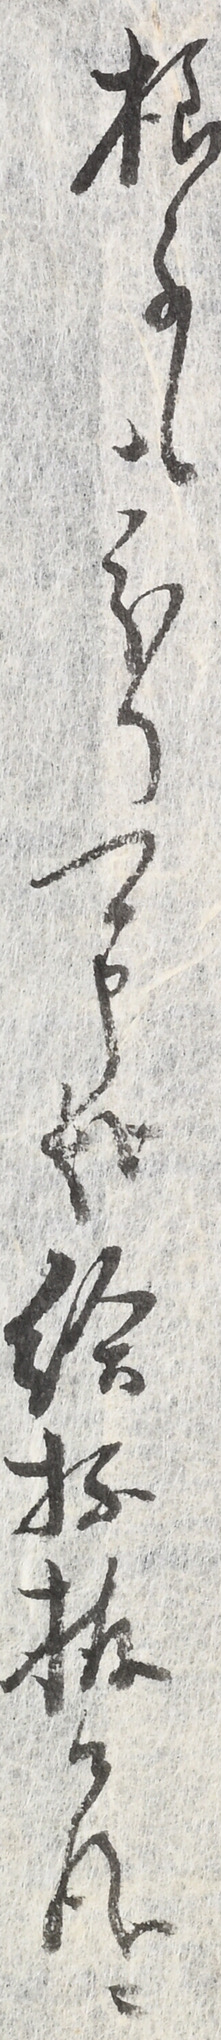様子も分り可申哉給杯拵候様ニ
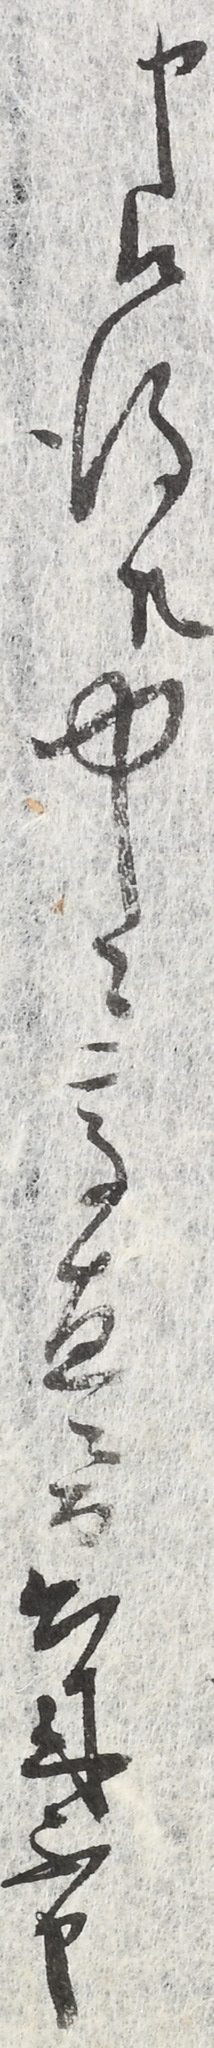申候得共中々高直ニ而出来不申
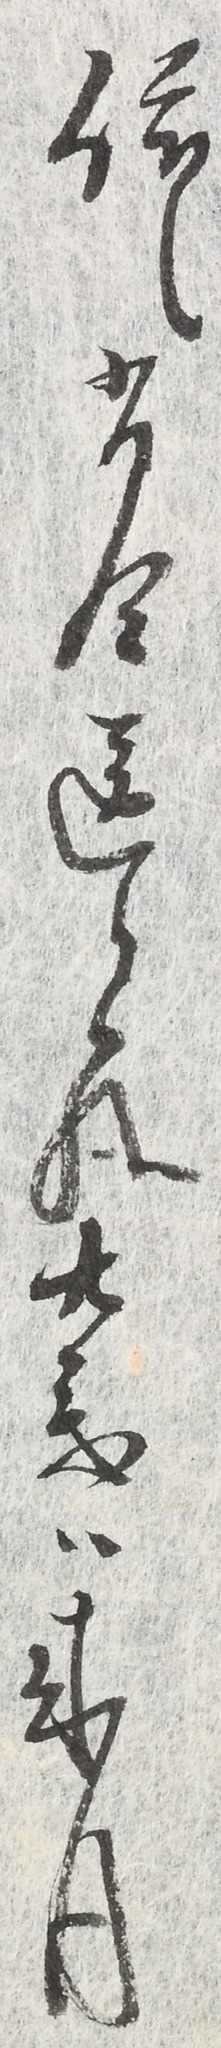依之有合送り候様此義ハ来月

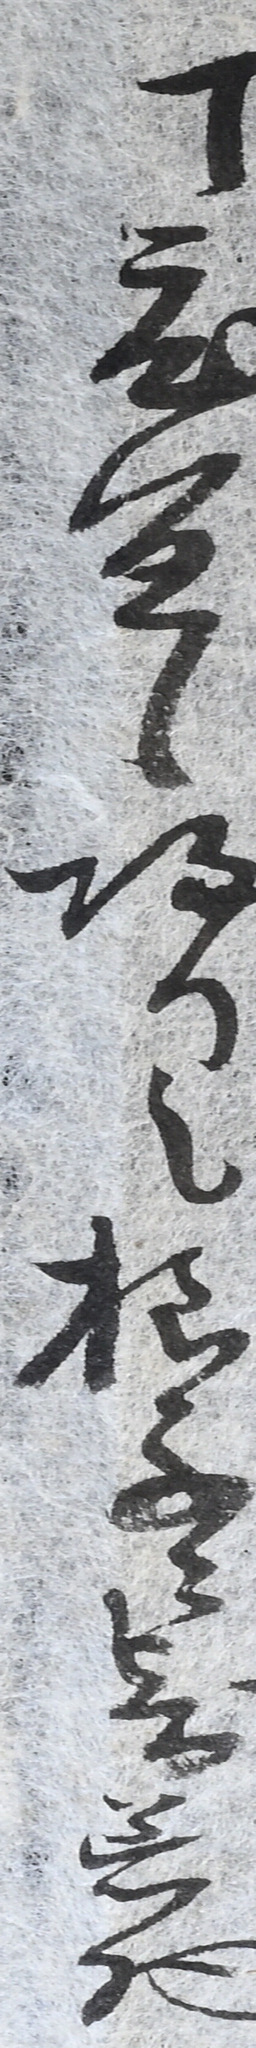丁度宜候帰り之様子ニ寄着物
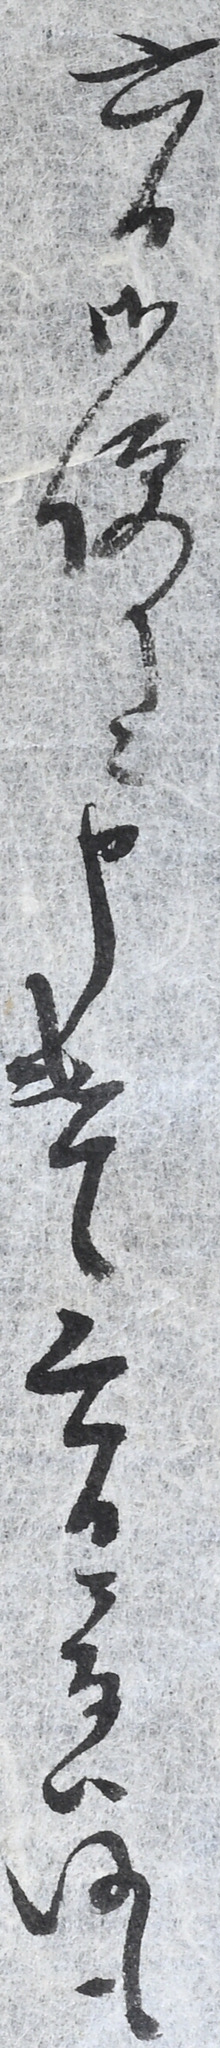六日御便りニ申遣候今日ニ而ハ何も
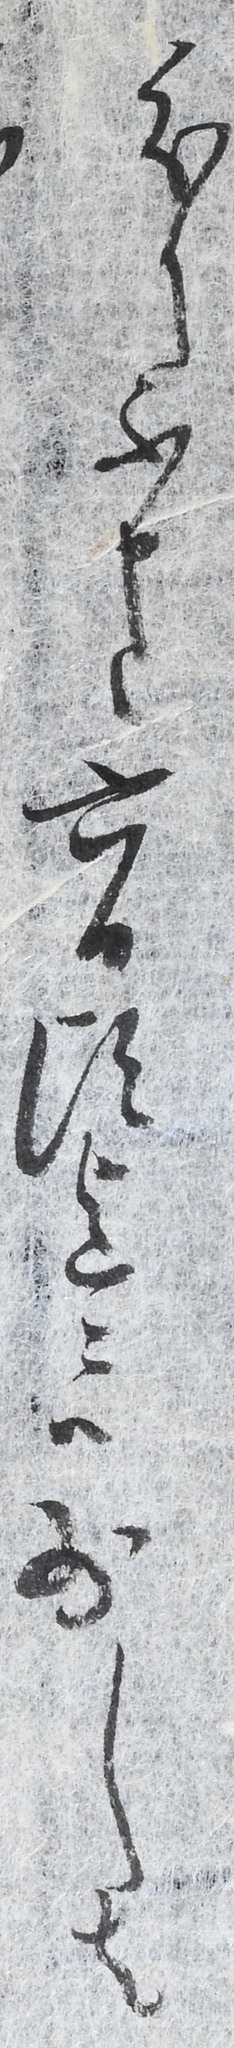分り不申六日頃迄ニハ少し者
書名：（書状）
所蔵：伊那市立高遠町図書館・合同会社AMANE
